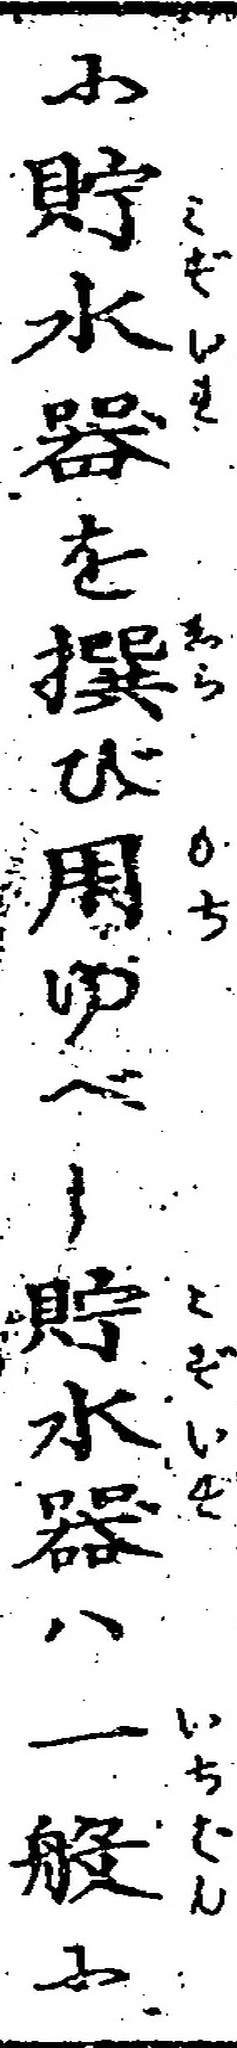に貯水器を選び用ゆべし貯水器は一般に
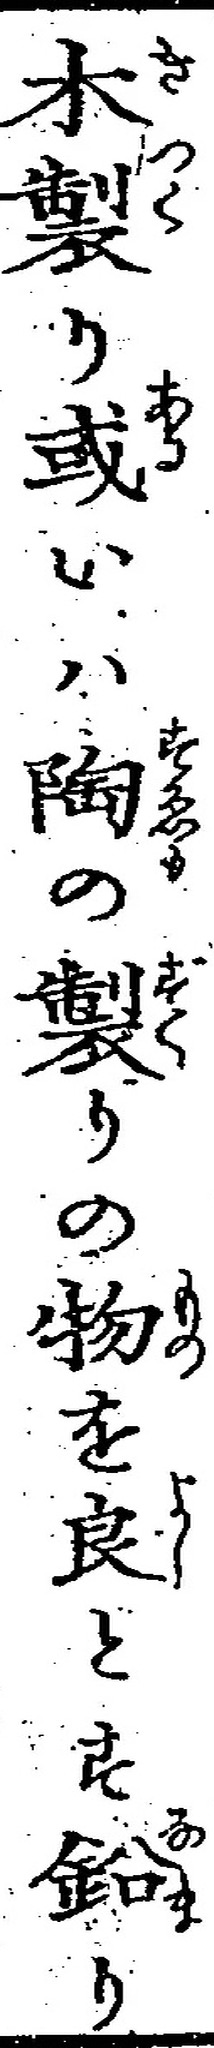木製り或いは陶の製りの物を良とす鉛り
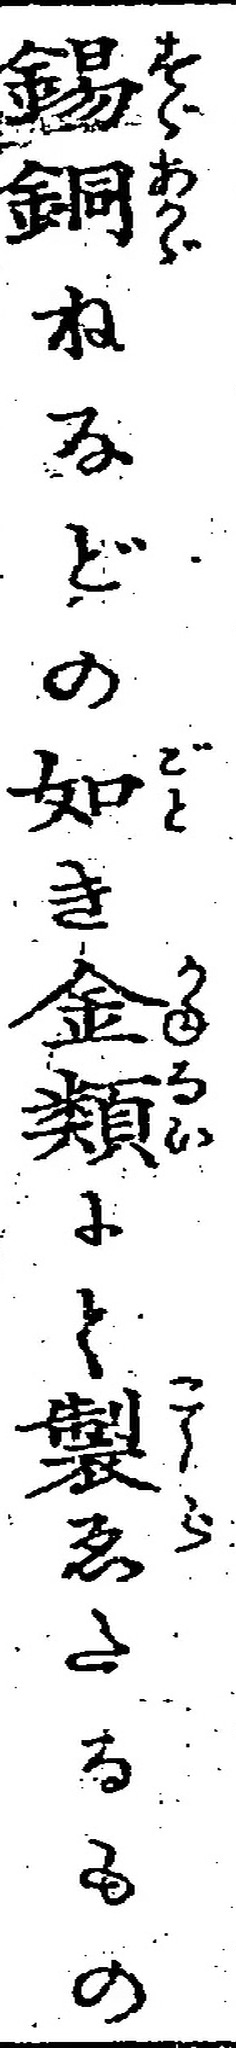錫銅ねるどの如き金類にと製ゑたるもの
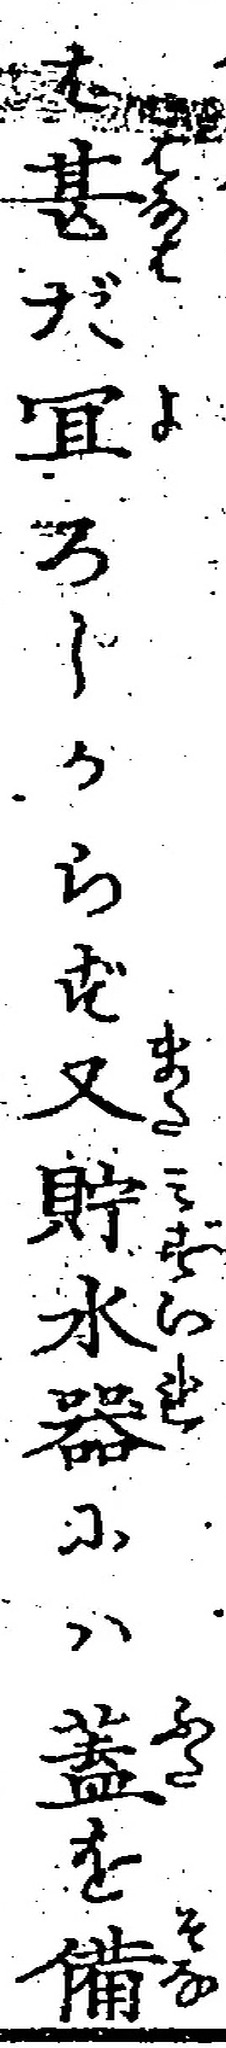は甚だ宜ろしからず又貯水器には蓋を備
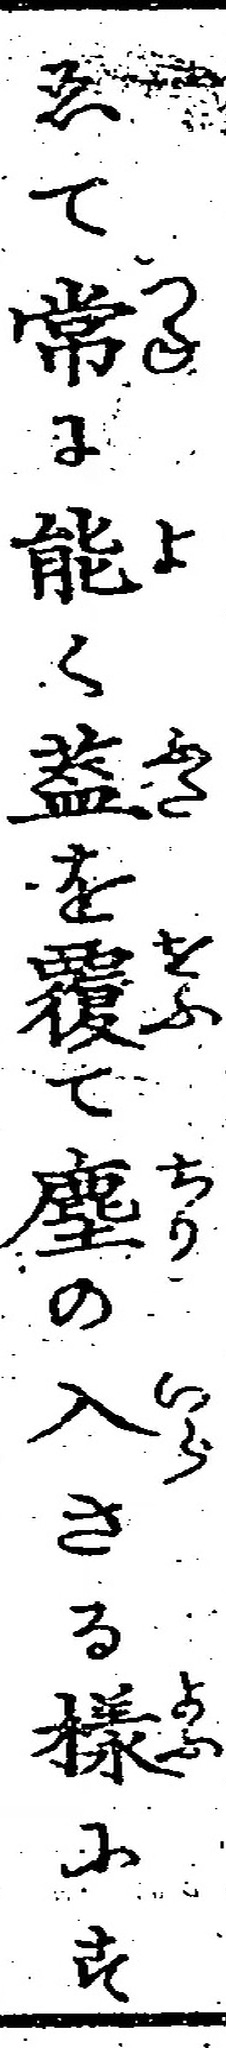ゑて常に能く蓋を覆て塵の入さる様にす
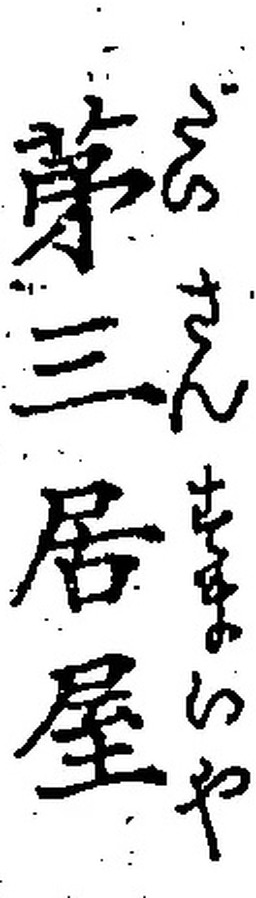第三居屋
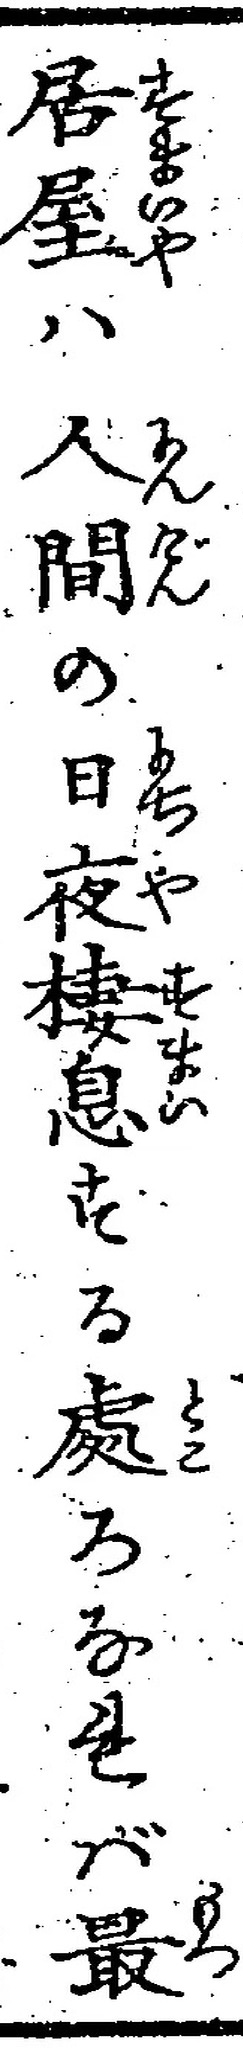居屋は人間の日夜棲息する処ろなれば最
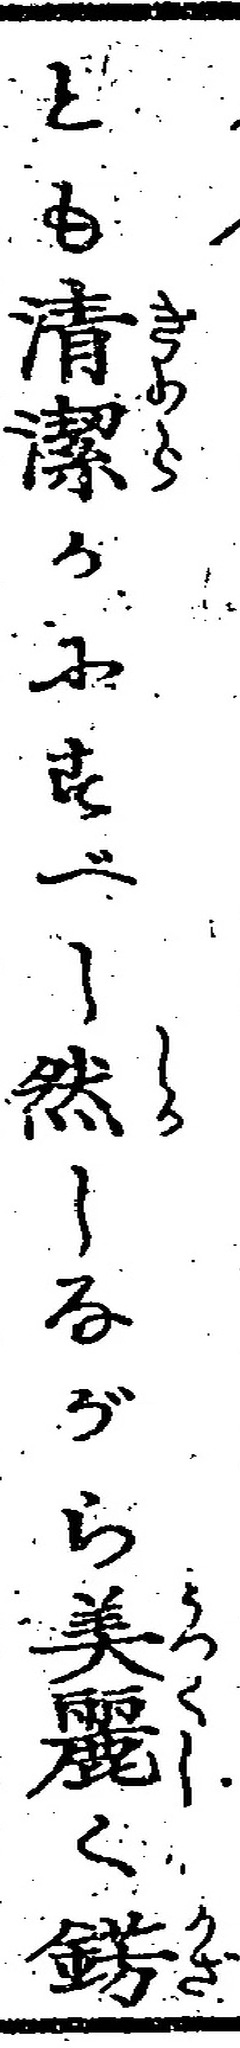とも清潔かにすべし然しながら美麗く錺

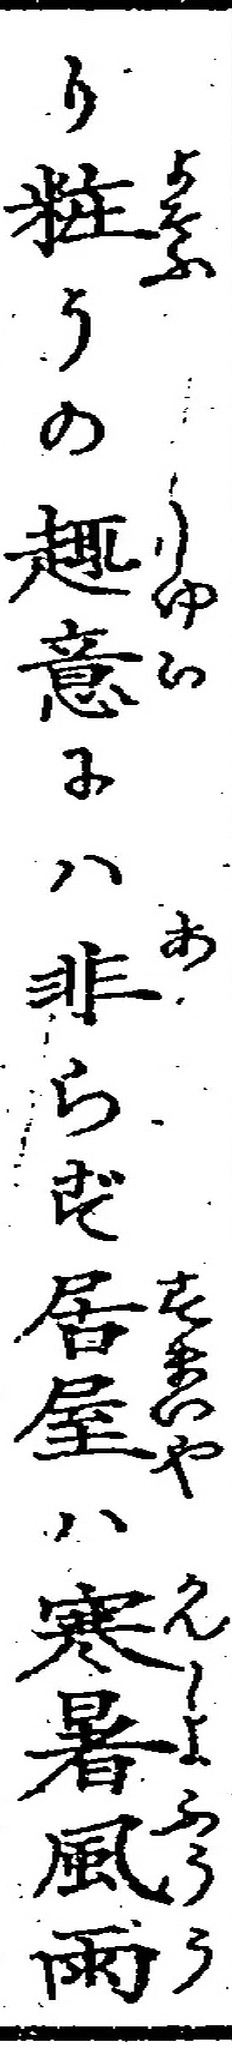り粧うの趣意には非らず居屋は寒暑風雨
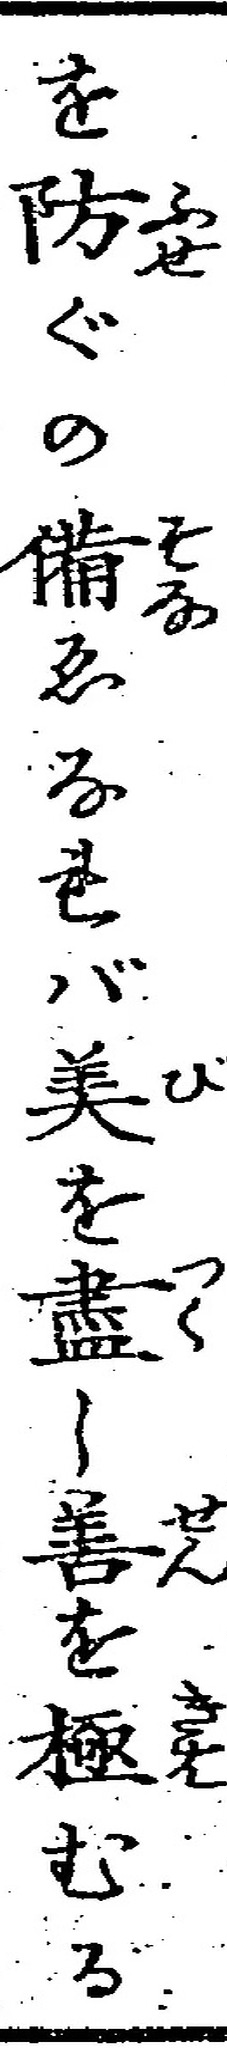を防ぐの備ゑなれば美を尽し善を極むる
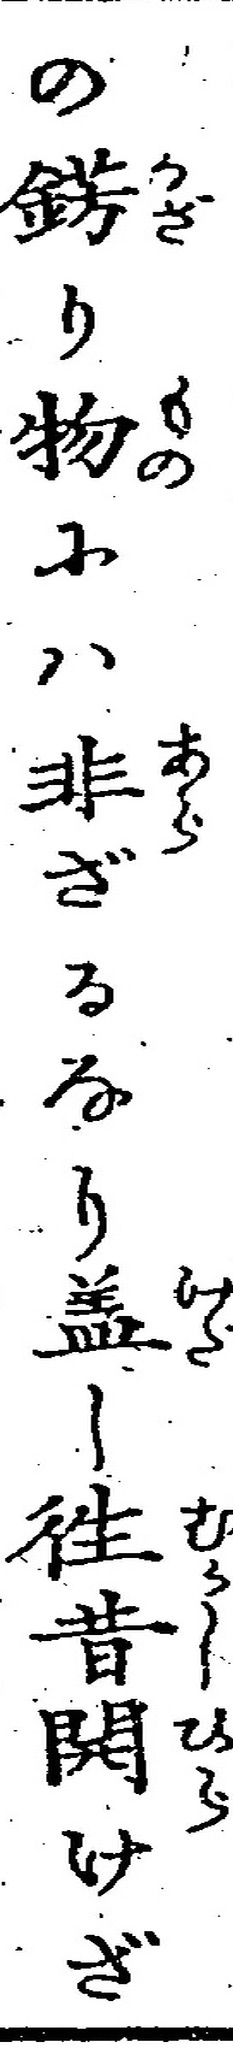の錺り物には非ざるなり蓋し往昔開けざ
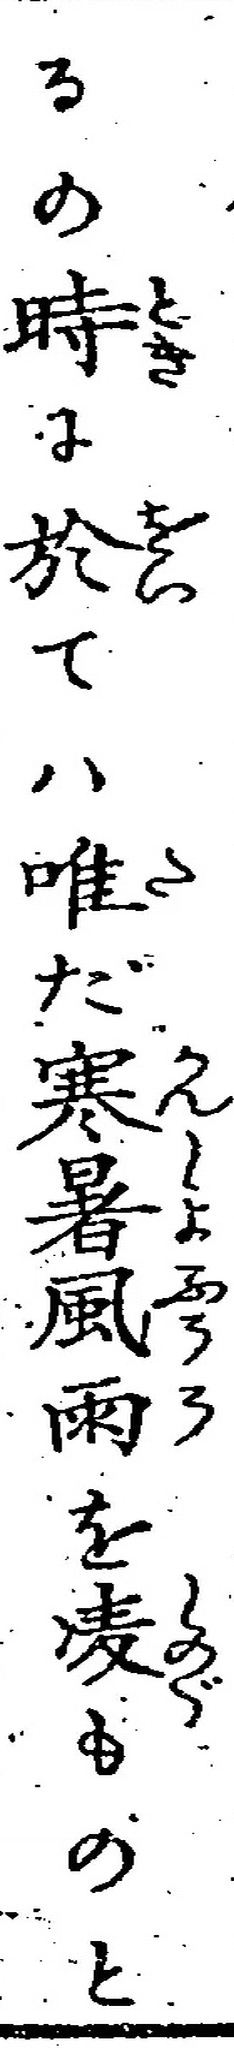るの時に於ては唯だ寒暑風雨を凌ものと
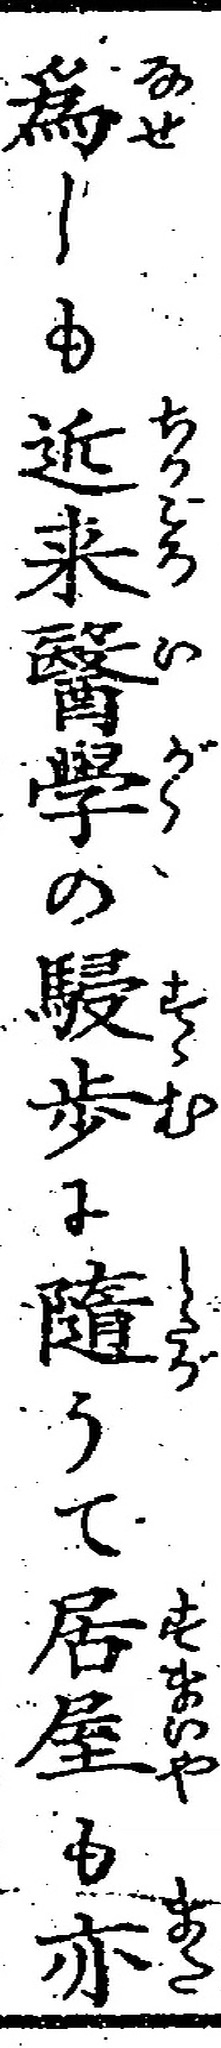為しも近来医学の駸歩に随うて居屋も亦
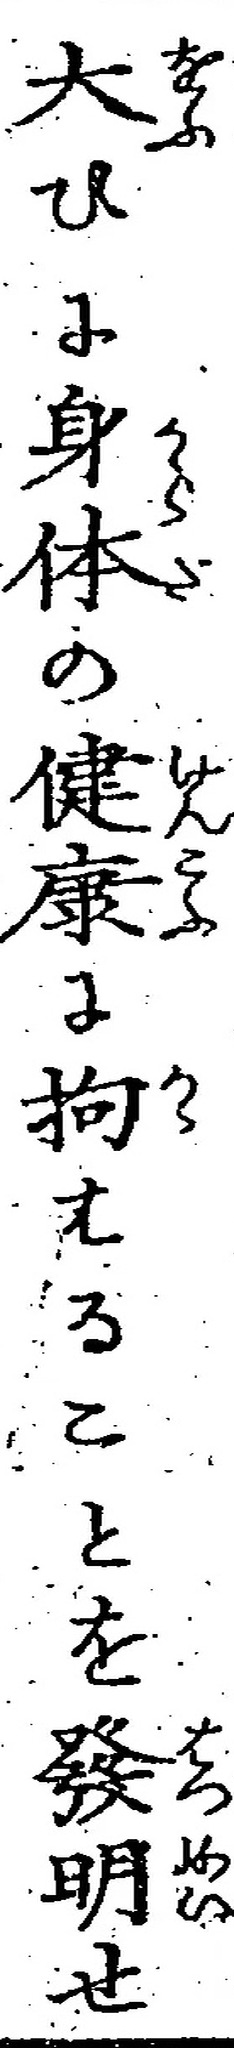大ひに身体の健康に拘わることを発明せ
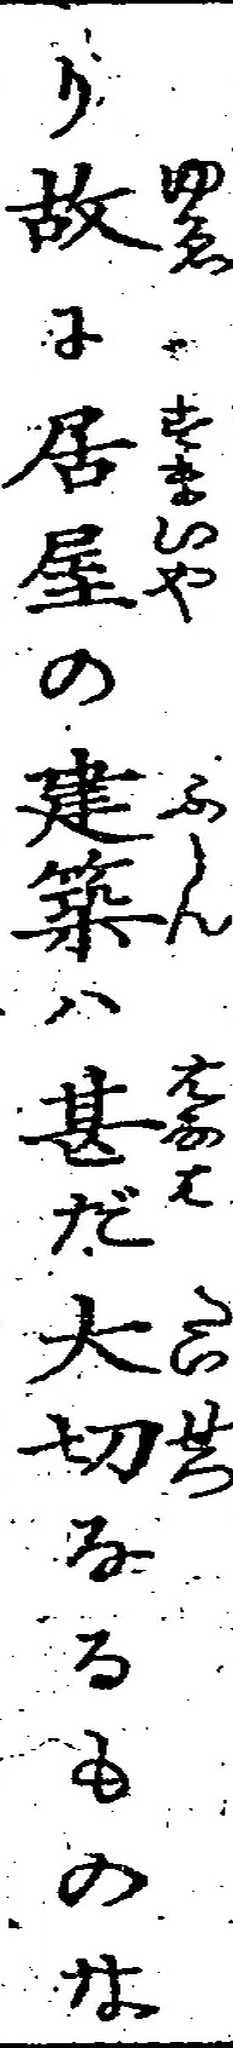り故に居屋の建築は甚だ大切なるものな
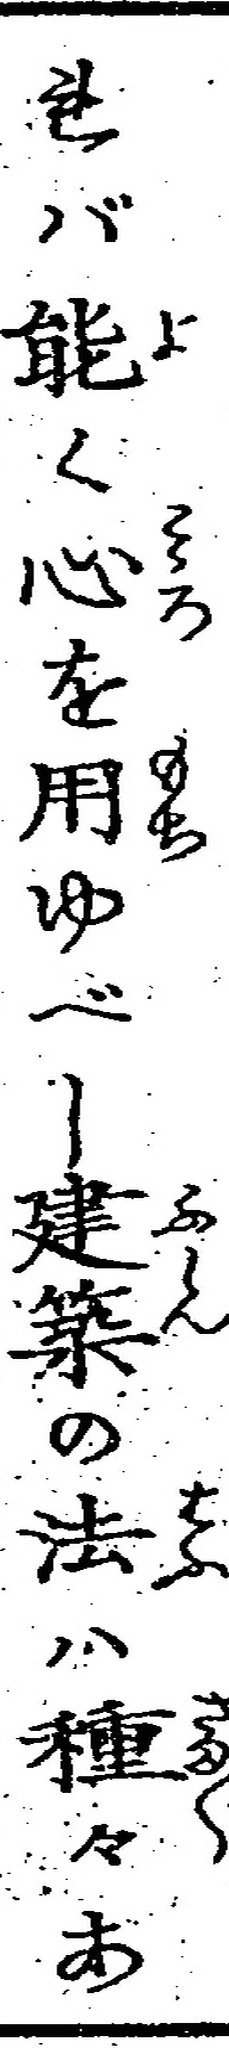れば能く心を用ゆべし建築の法は種々あ
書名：コレラ予防命乃後見
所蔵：国立国会図書館 National Diet Library, JAPAN
